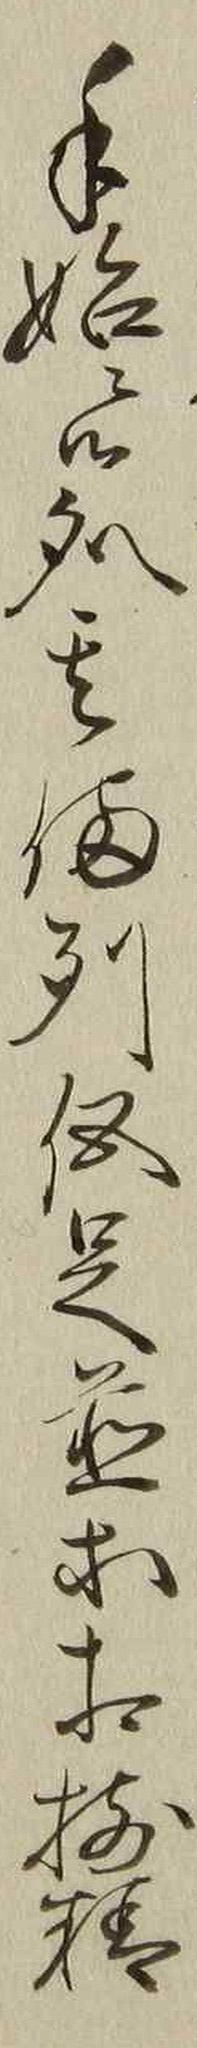手始に候処其備列伍足並等相揃精
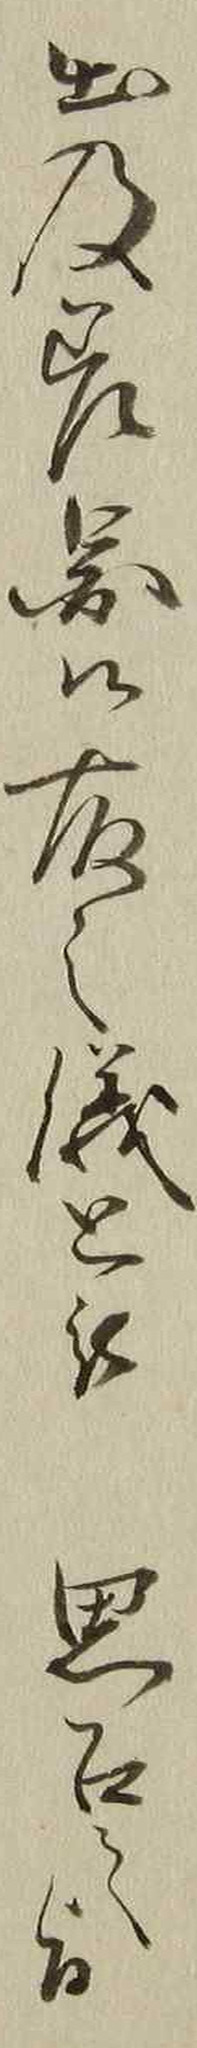出及差図侯故之儀と被思召之旨
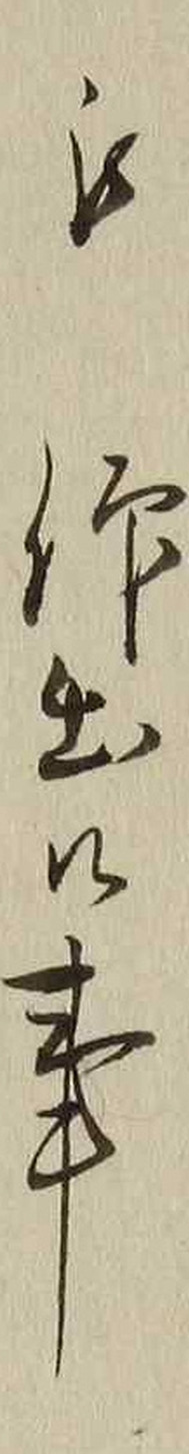被仰出候事
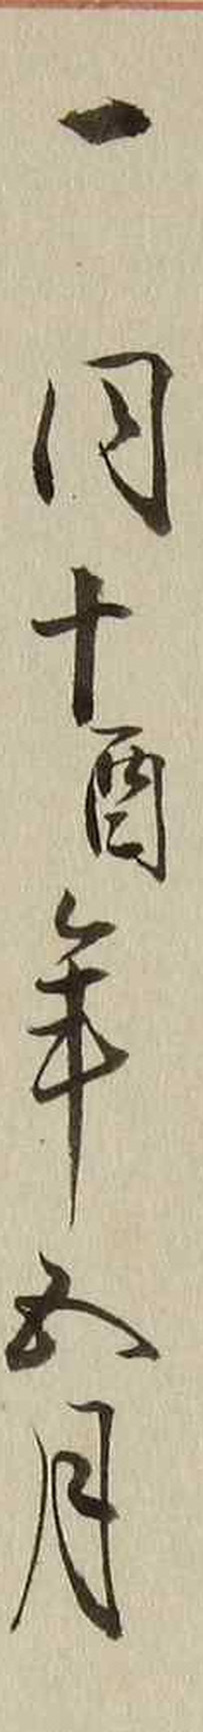一同十酉年五月
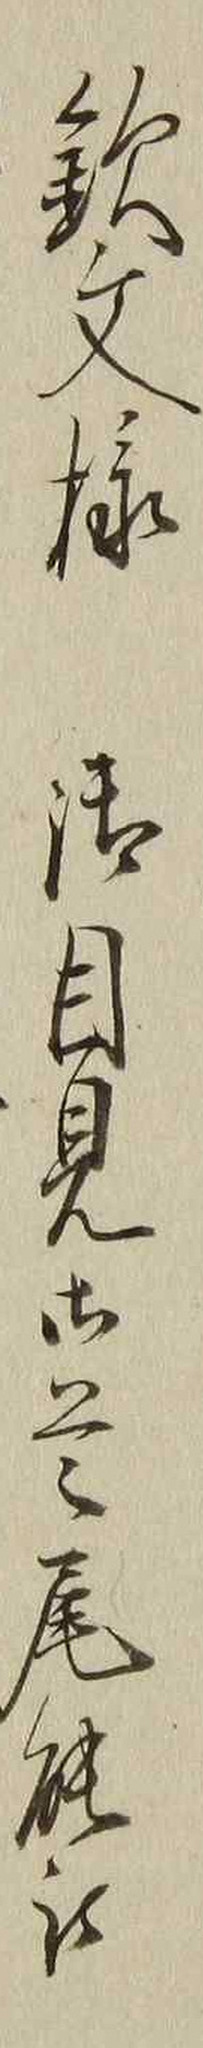欽文様御目見御首尾能被
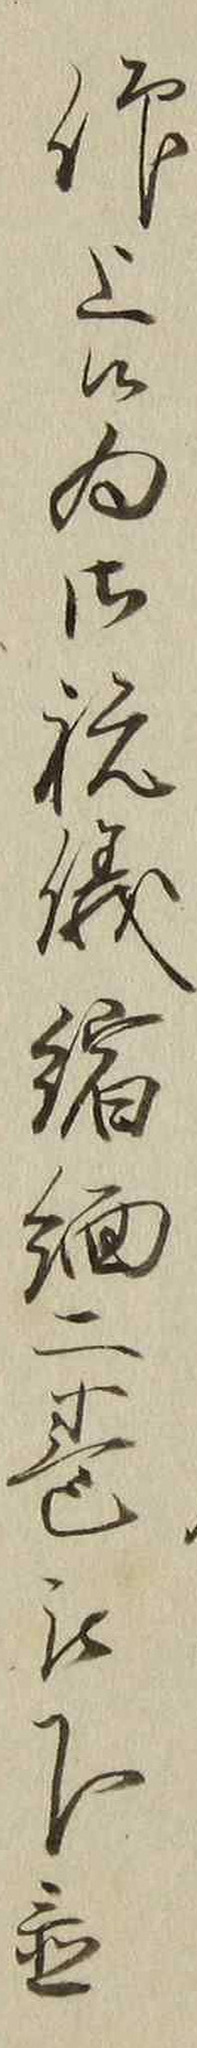仰上候為祝儀縮緬二巻被下置
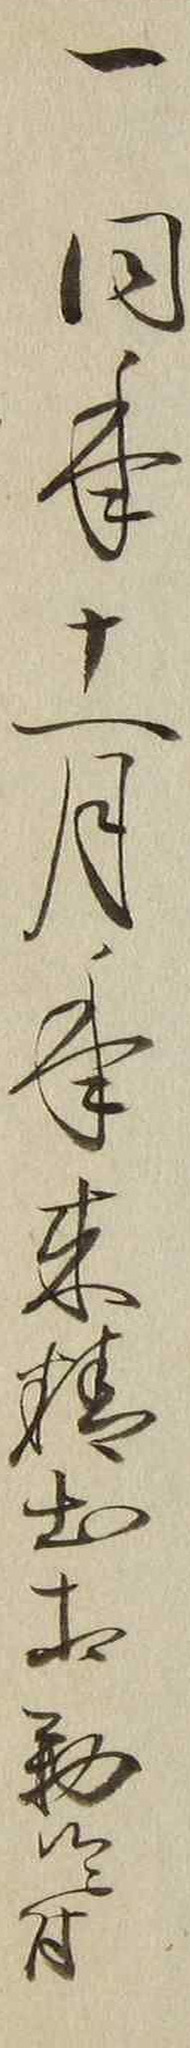一同年十一月年来精出相勤候に付
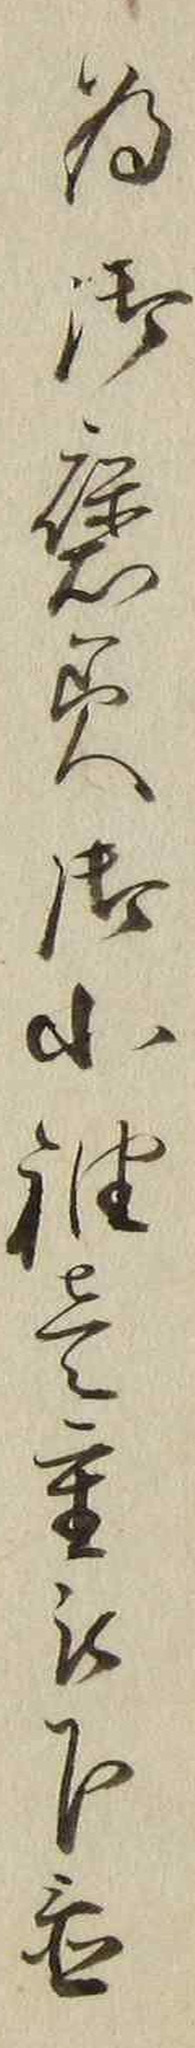為御褒美御小袖壱重被下置
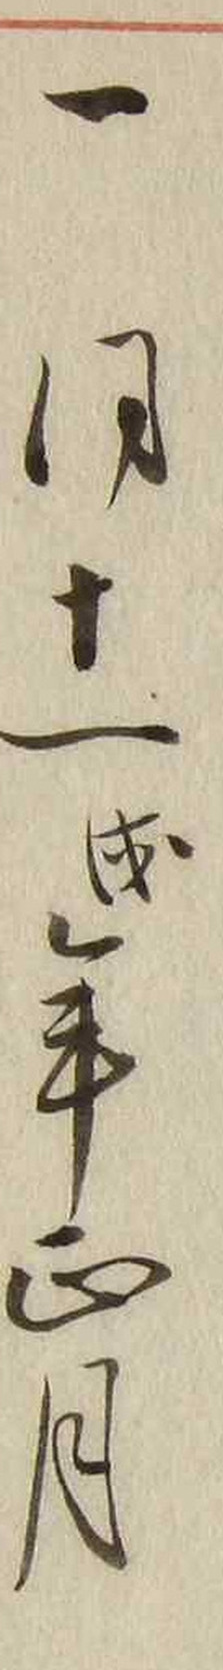一同十一戌年正月
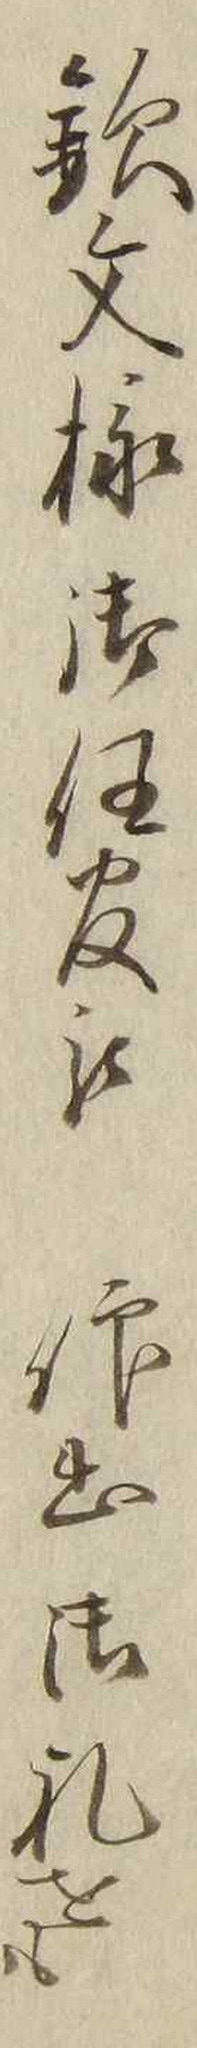欽文様御任官被仰出御礼をも

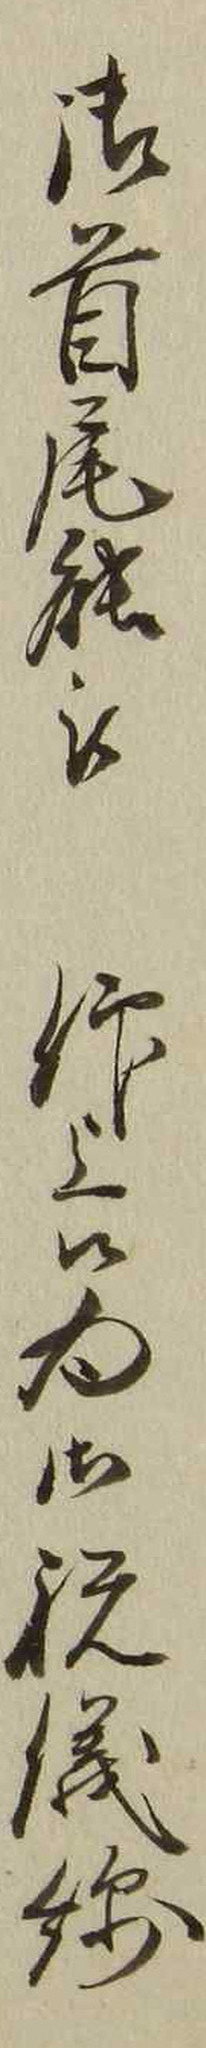御首尾能被仰上候為御祝儀綿
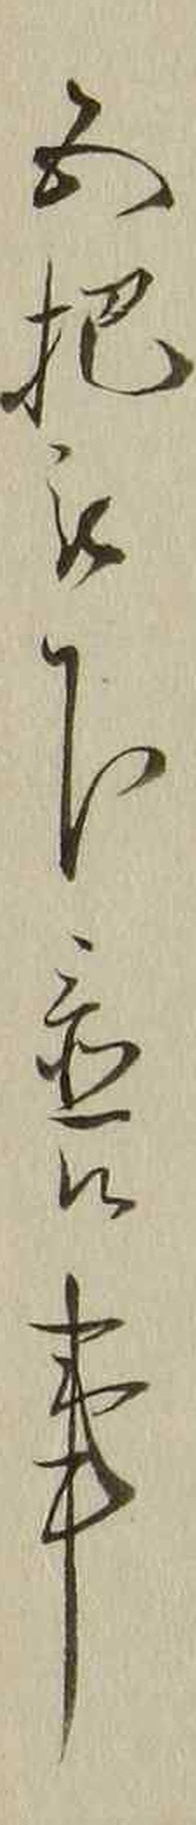五把被下置候事
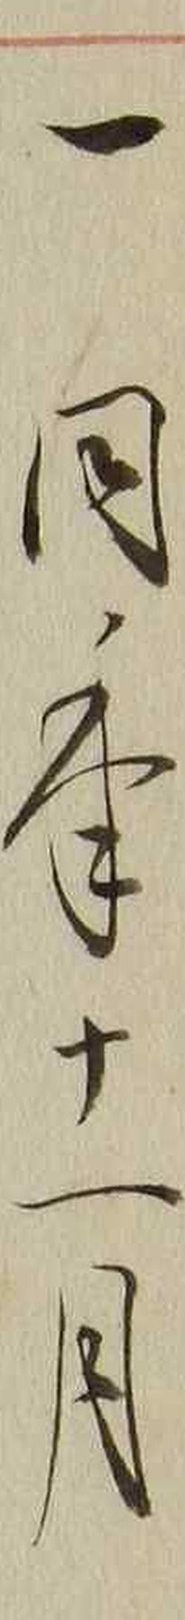一同年十一月
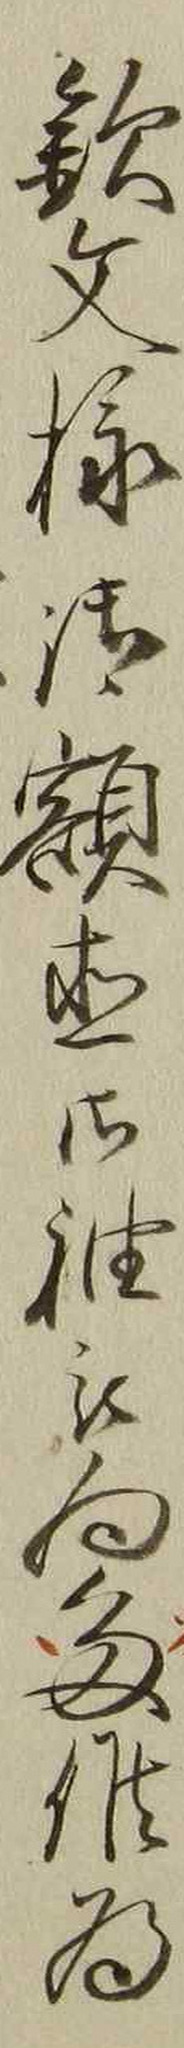欽文様御額直御袖被為多候為
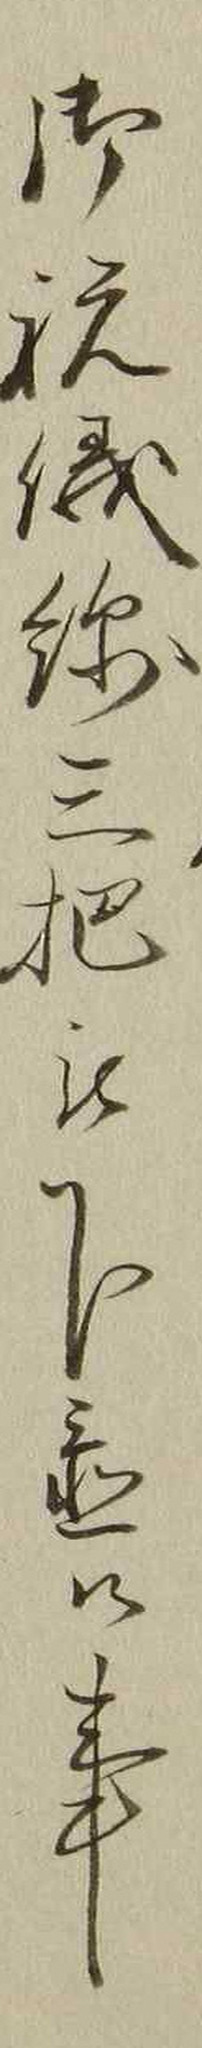御祝儀綿三把被下置候事
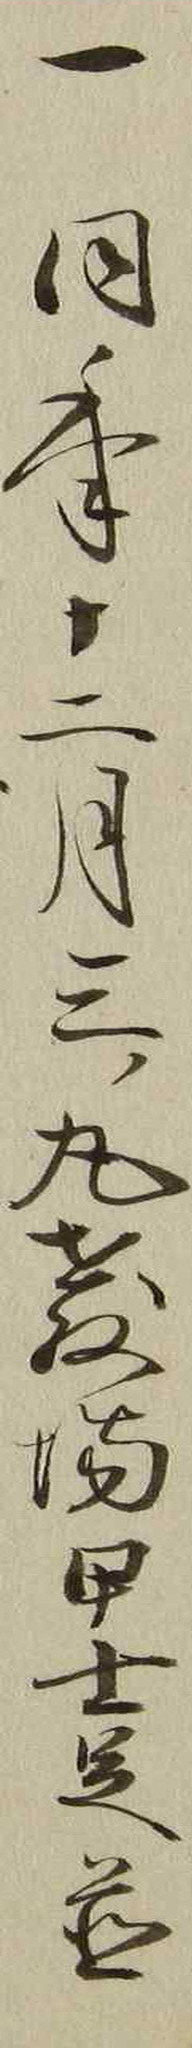一同年十二月三ノ丸教場甲士足並
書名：諸士系譜　巻之103　か之部11
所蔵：会津若松市立会津図書館
